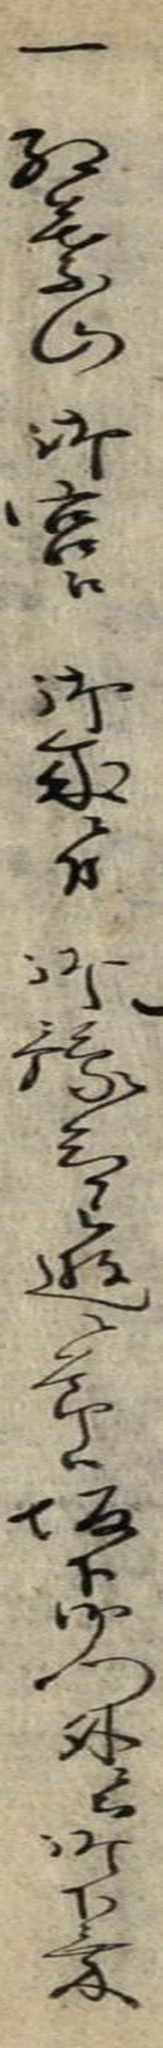一紅葉山御宮江御成に付御予参被遊候節は坂下御門外にて御下乗
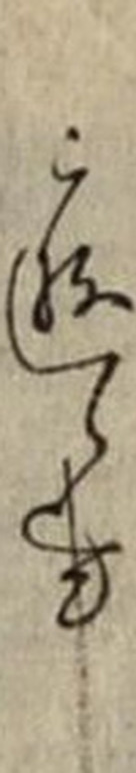被遊候事
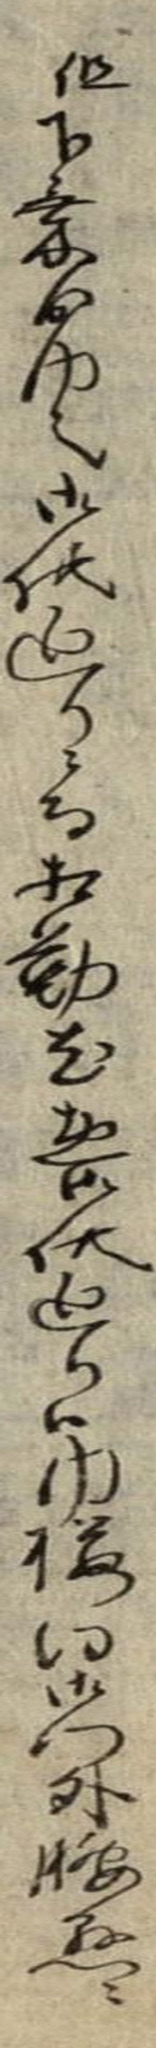但下乗ゟ内之御供廻りにて相勤尤惣御供廻りは内桜田門外腰懸に
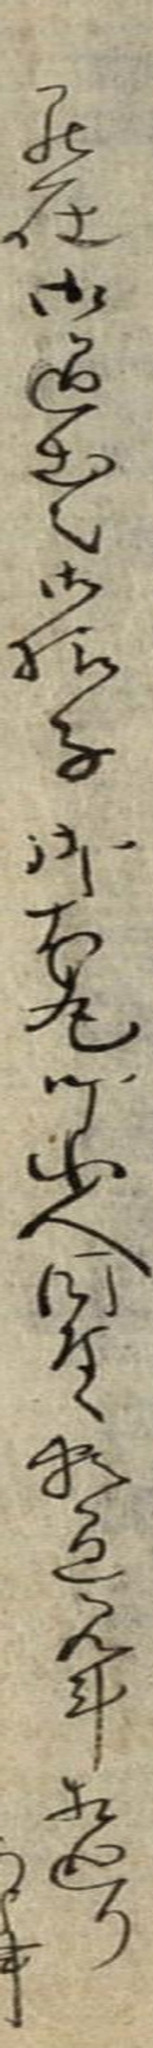罷在御退出之御様子御本丸御小人目付へ頼置見計相廻り可申事
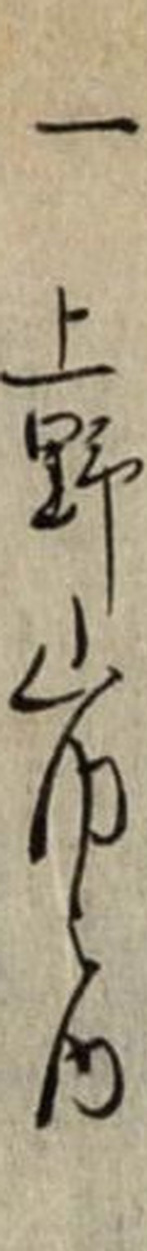一上野山内之内
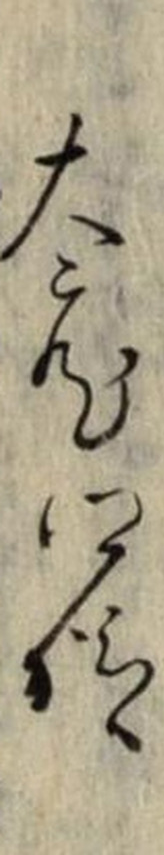大蔵卿様
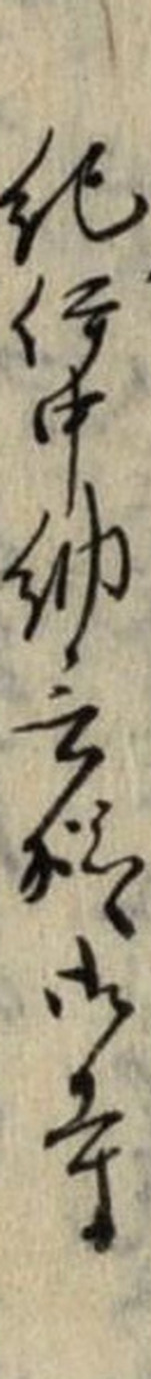紀伊中納言様功徳院
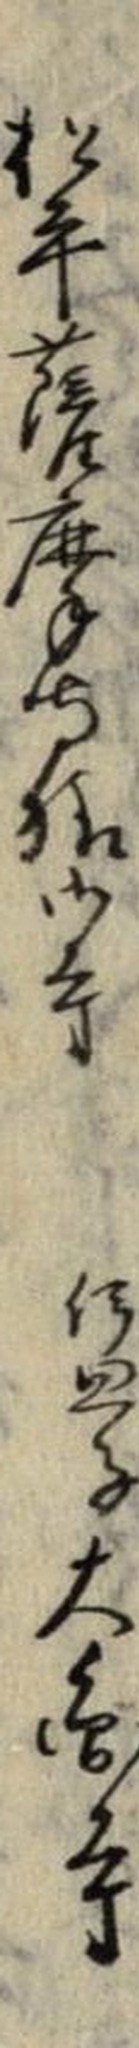松平薩摩守様御寺伊皿子大円寺
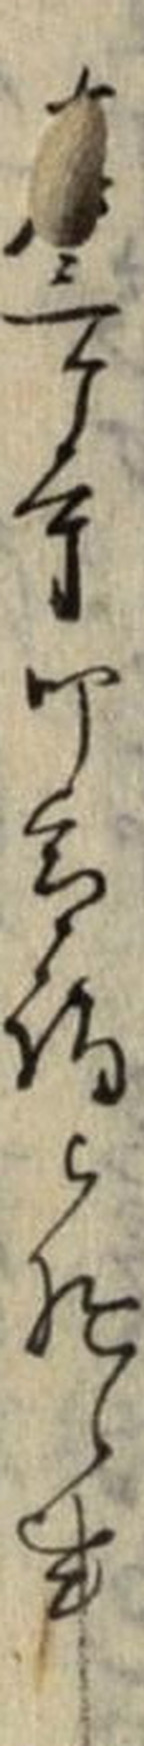右三ケ寺御参詣被遊候事
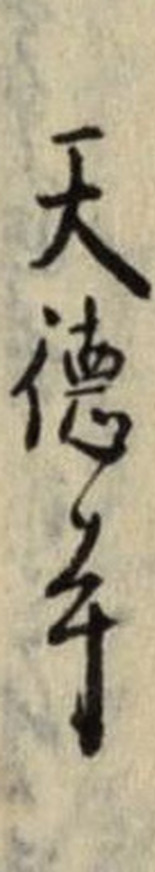天徳寺
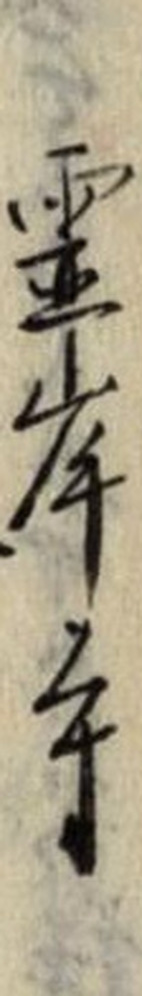霊岸寺
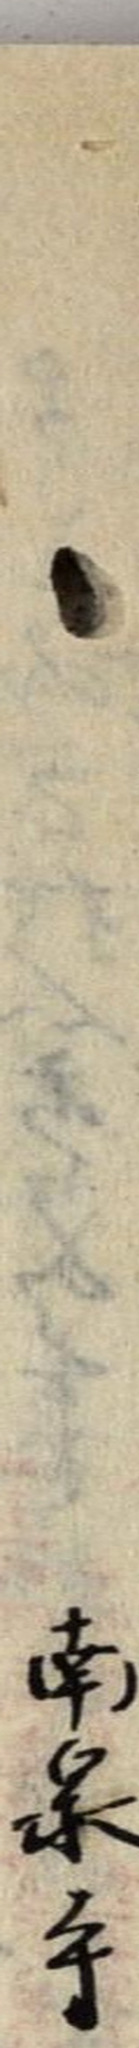南泉寺
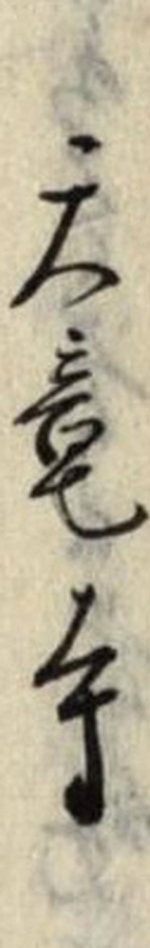天竜寺
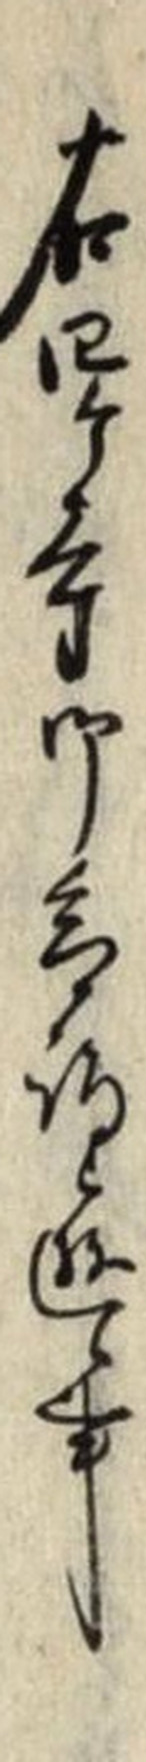右四ケ寺御参詣被遊候事
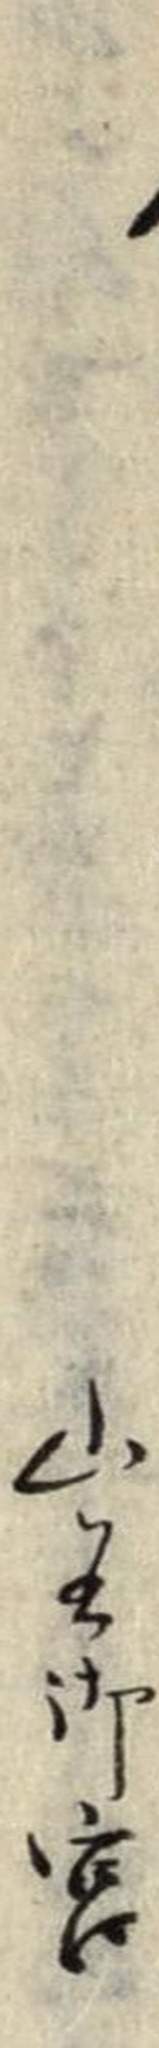山王御宮
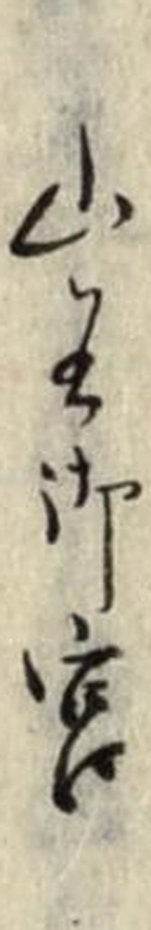山王御宮
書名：三都并道中之部
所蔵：福井県文書館 Fukui Prefectural Archives
